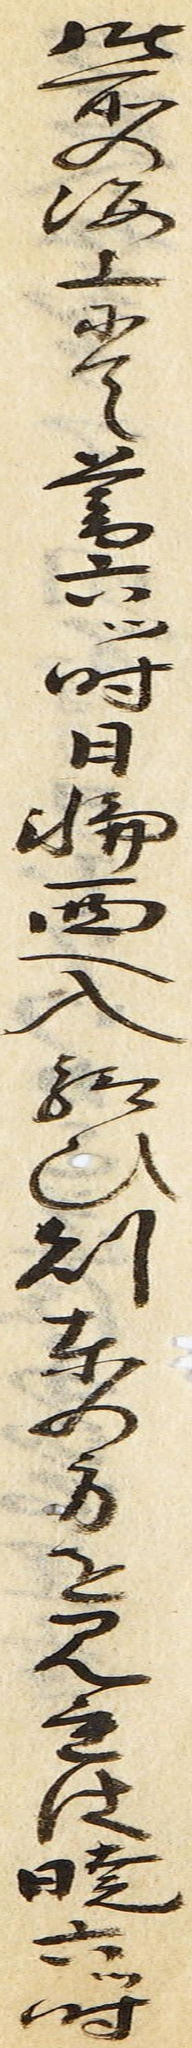此所の海上にて暮六ッ時日輪西へ入給ひ則東の方を見れは暁六ッ時
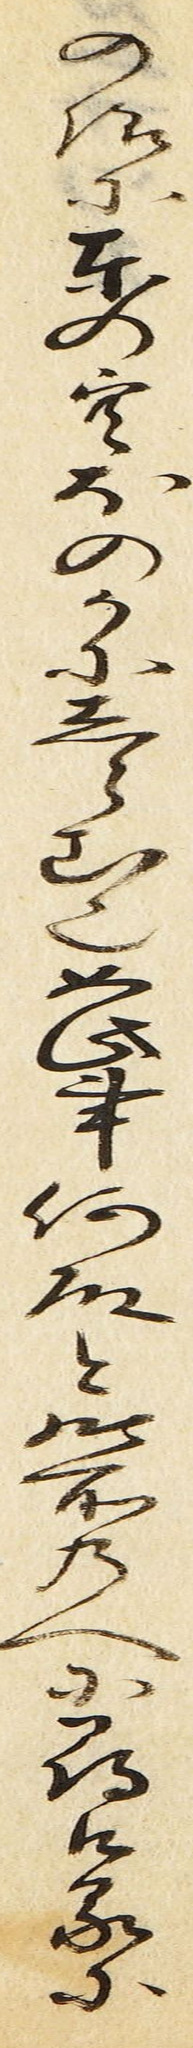の様に東の空ほのかにしらむ也如此事何故と此所の人に尋けるに
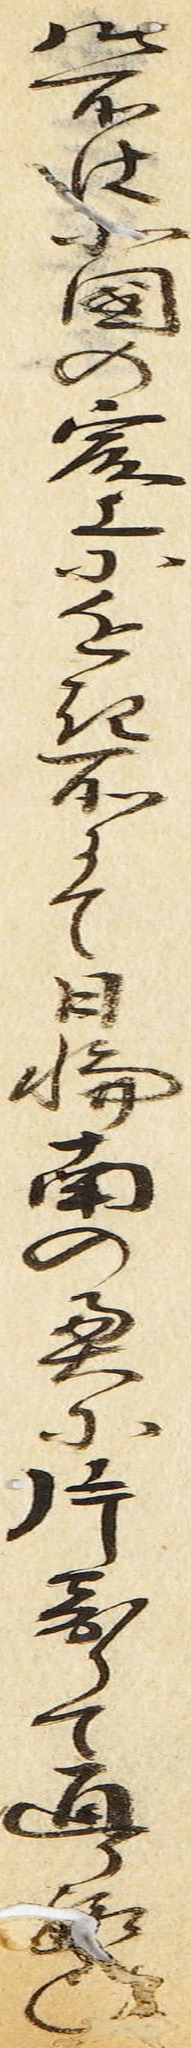此所は北国の最上に近き所にて日輪南の奥に片寄りて通り給也
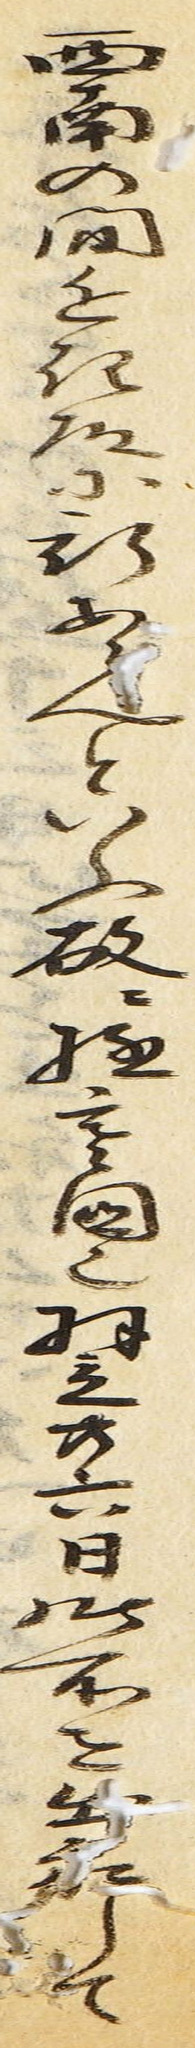西南の間近き故に期あらんといふ故に極寒国也翌廿六日此所を出船して
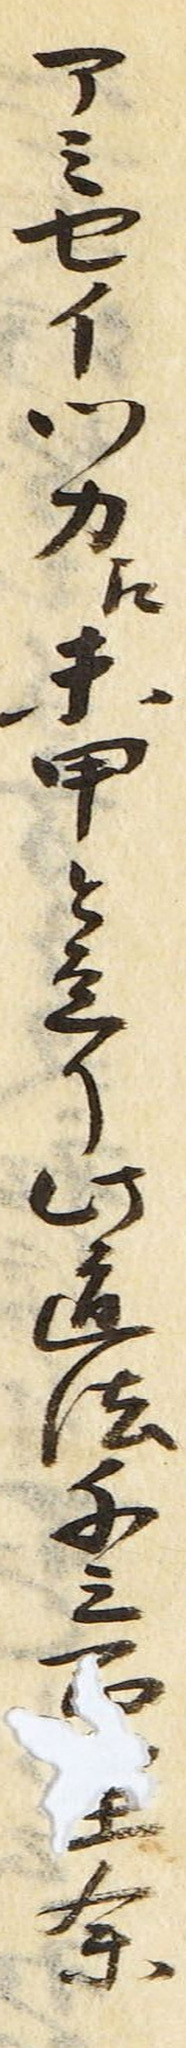アミセイツカえ未申と走り此道法千三百里余

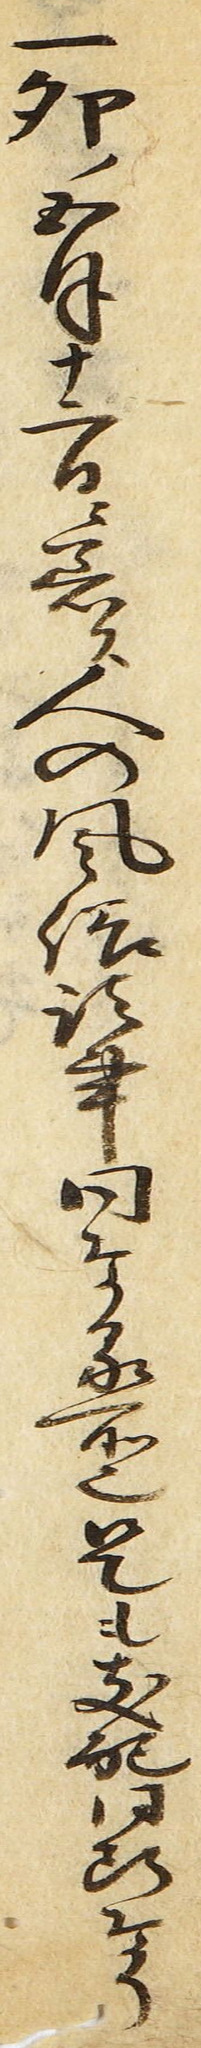一卯ノ五月十二日に着す人の風俗事同なる所也是も支配同断なり
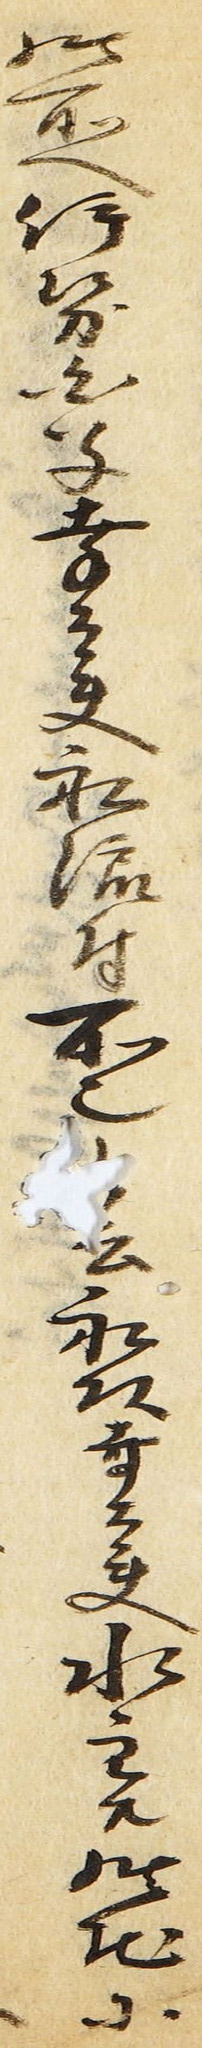此所へ伊勢白子幸太夫船流付所也船頭幸太夫水主共此地に
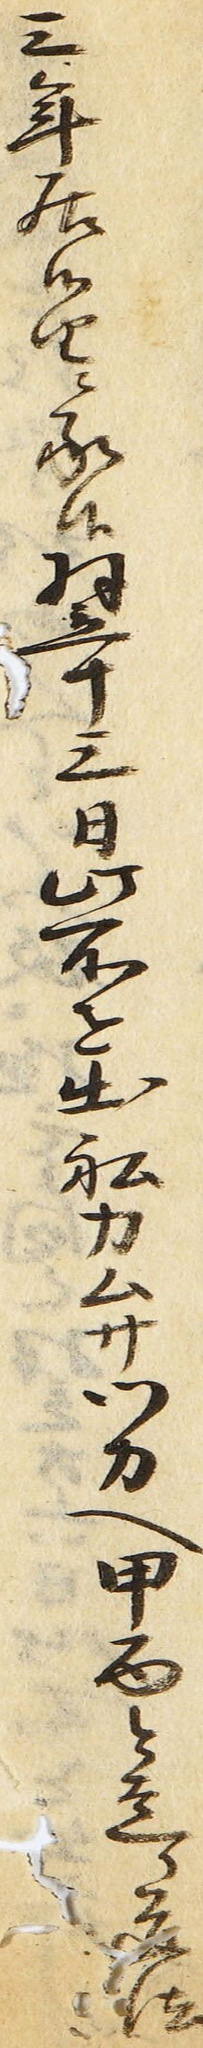三年居候由に承候翌十三日此所を出船カムサツカへ甲酉と走り道法
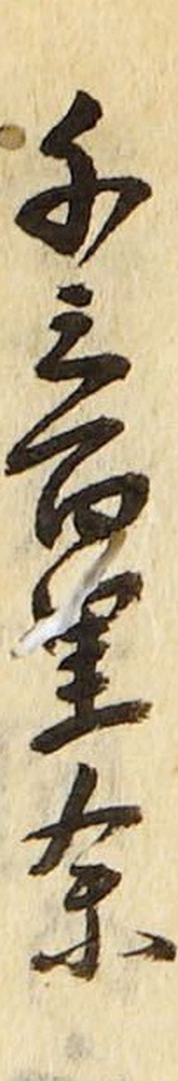千三百里余
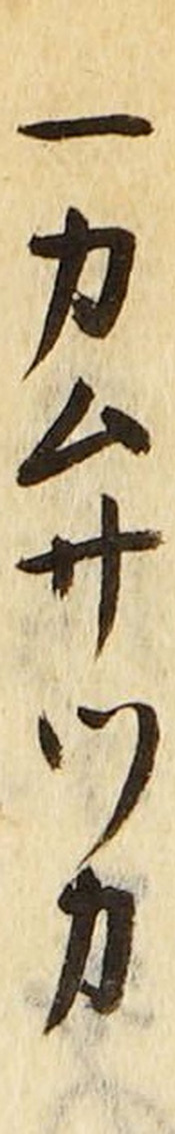一カムサツカ
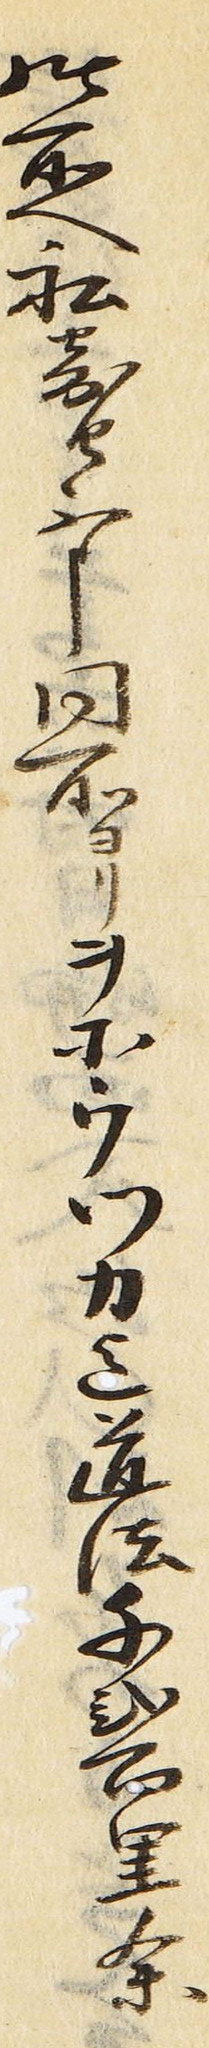此所へ船寄せ不申同所よりヲホウツカ迄道法千弐百里余
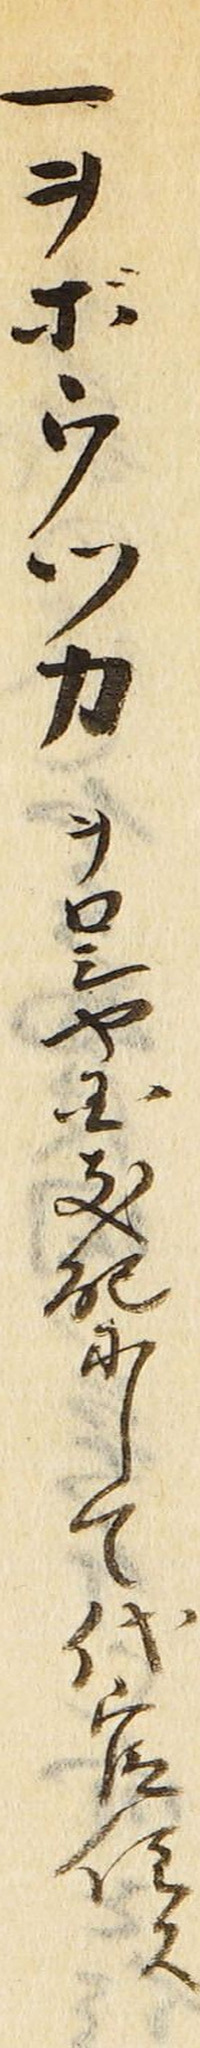一ヲホウツカヲロシヤ国支配にして代官住す
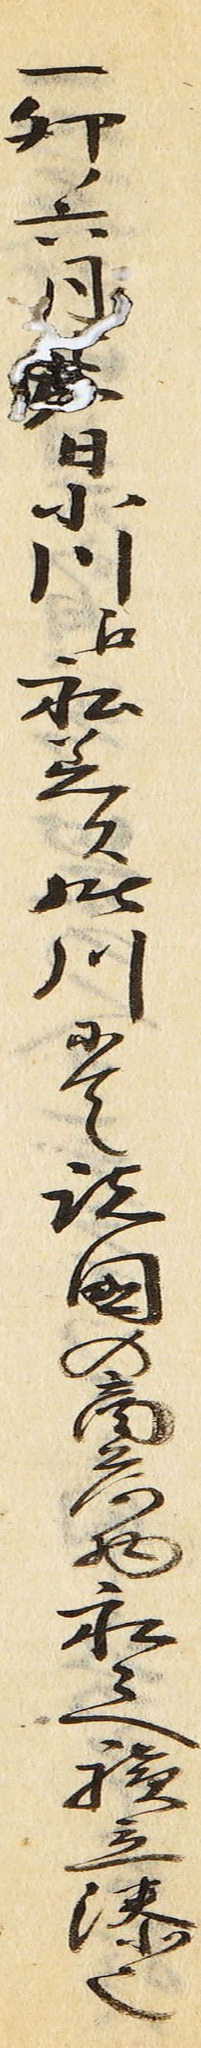一卯ノ六月日小川え船着す此川にて諸国の商荷物船々へ積立湊也
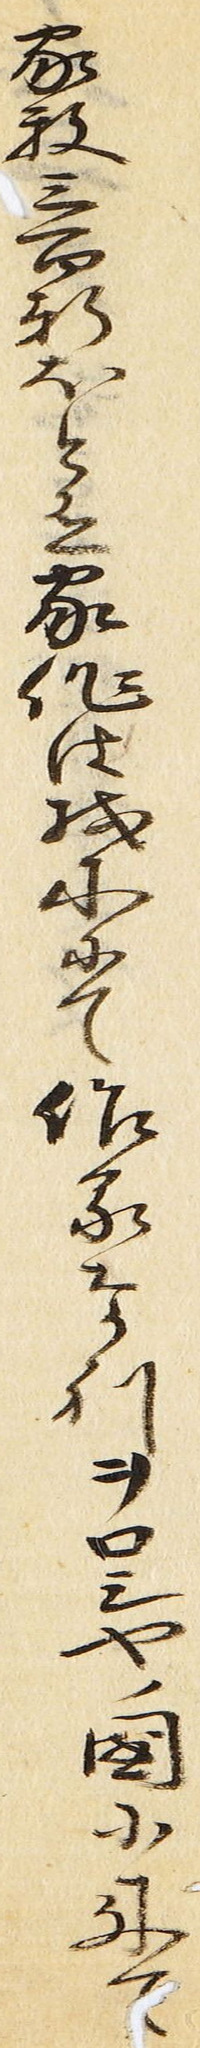家数三百軒ほと有家作は材木にて作るなりヲロシヤノ国に来て
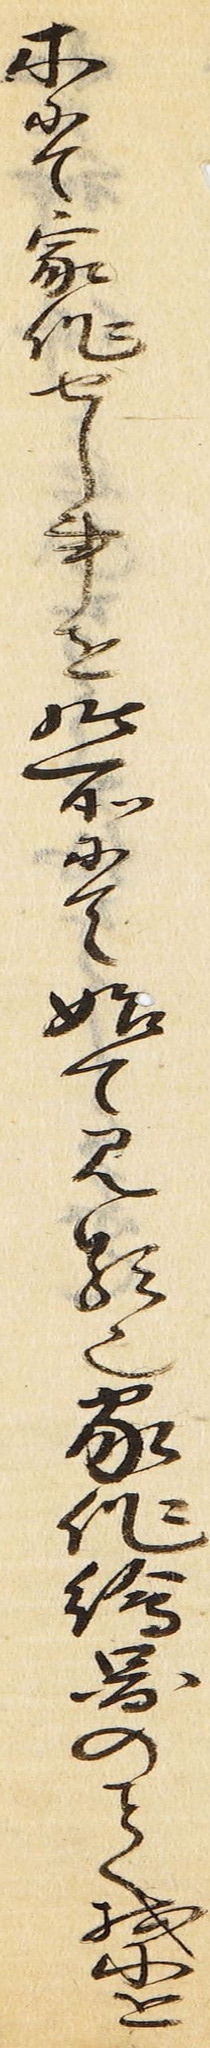木にて家作せし事を此所にて始て見る也家作絵図のことく材木を
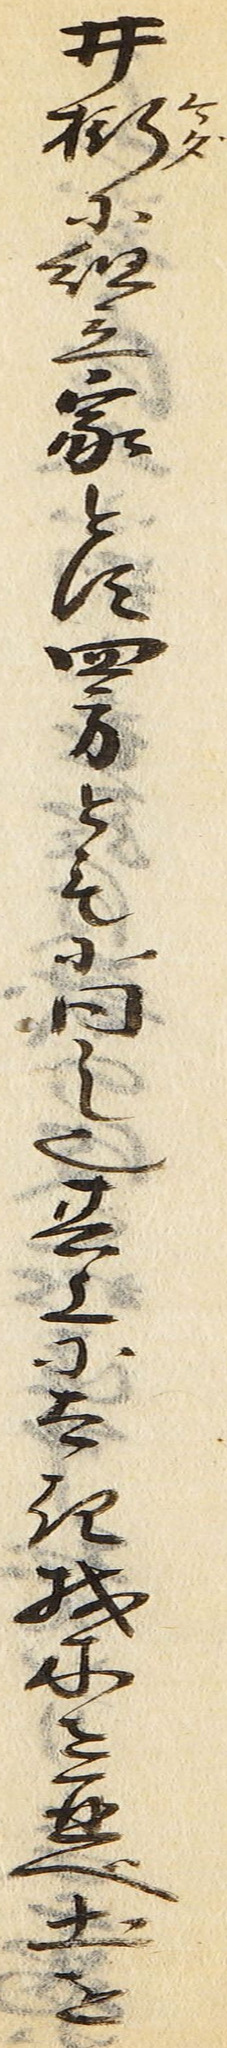井桁に組立家とす四方ともに同し也其上に太き材木を並べ土を
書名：外国漂流記
